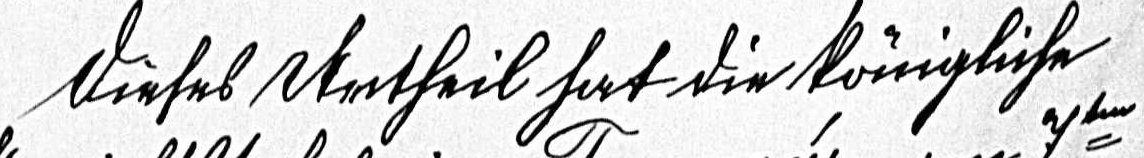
Dieses Urtheil hat die königliche
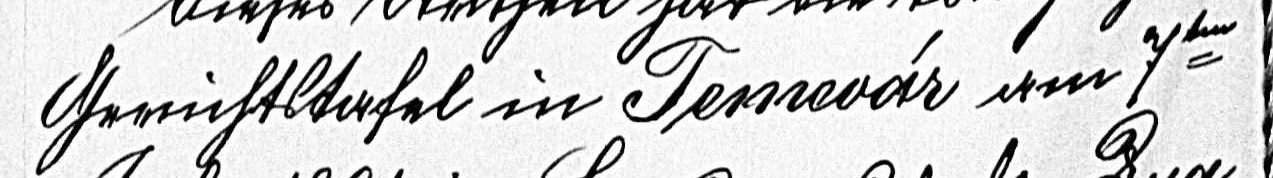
Gerichtstafel in Temevár am 7ten
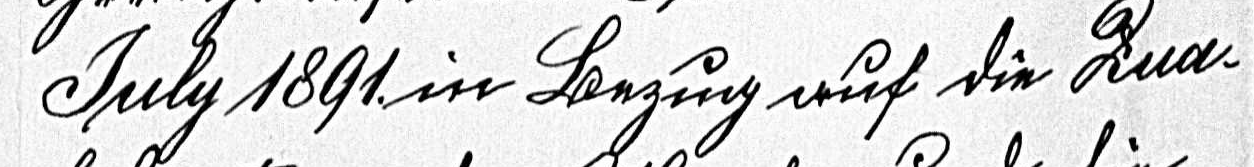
July 1891 in Bezug auf die Qua¬
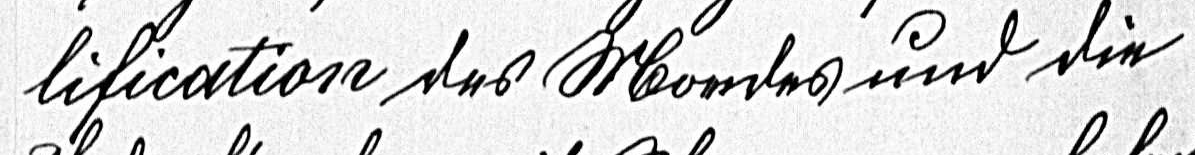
lification des Mordes und die
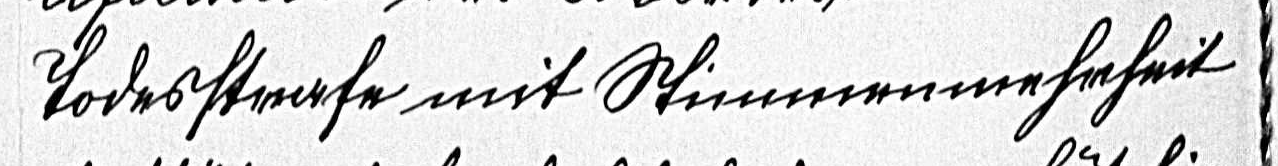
Todesstrafe mit Stimmenmehrheit
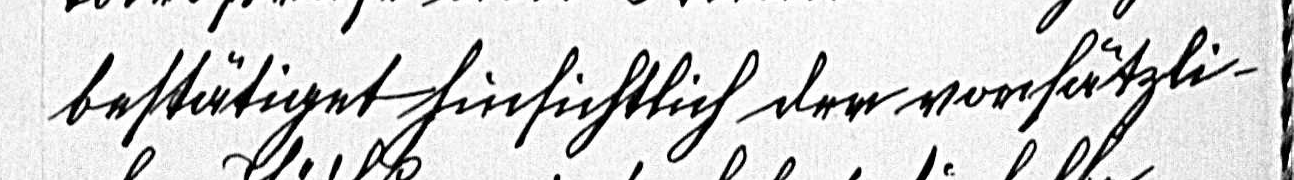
bestätiget hinsichtlich der vorsätzli¬
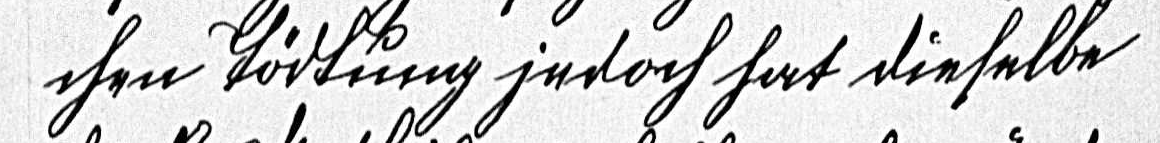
chen Tödtung jedoch hat dieselbe
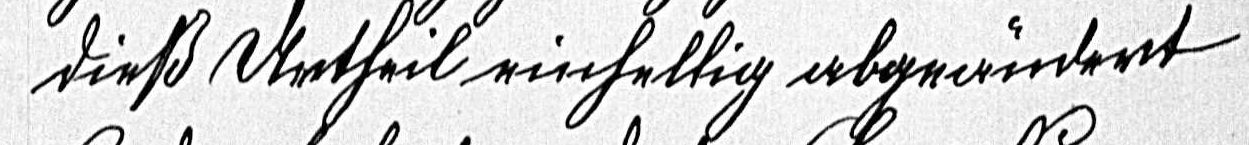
dieß Urtheil einhellig abgeändert
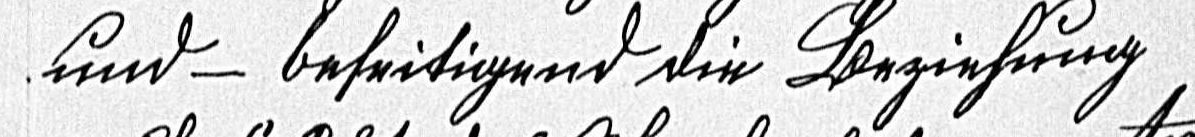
und – beseitigend die Beziehung
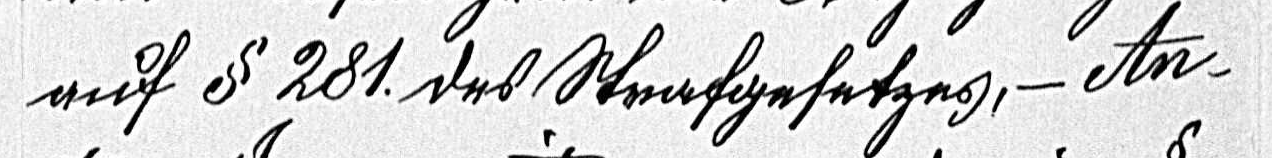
auf §281 des Strafgesetzes, -- An¬
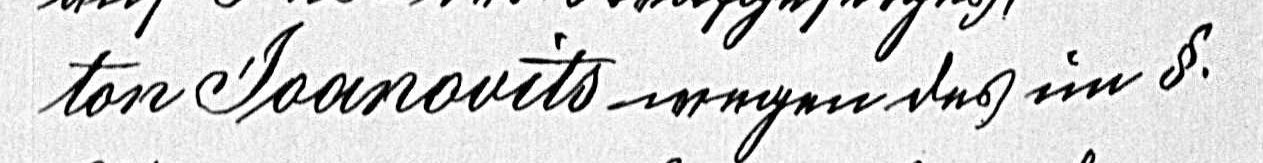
ton Ioanovits wegen des im §
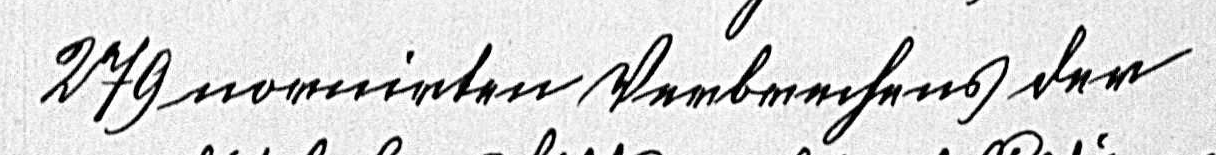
279 normirten Verbrechens der
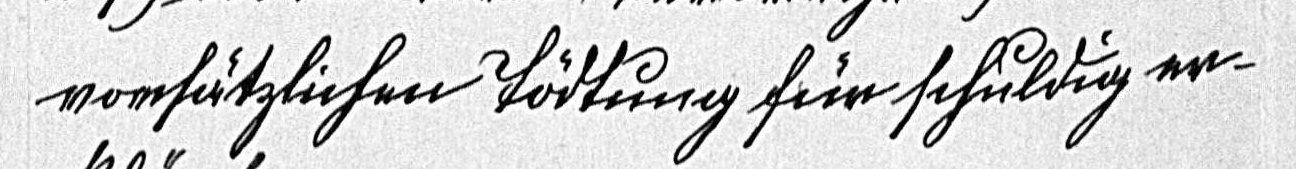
vorsätzlichen Tödtung für schuldig er¬
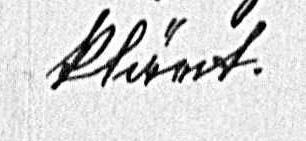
klärt.
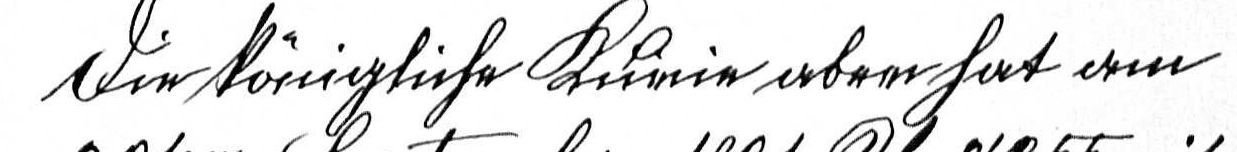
Die königliche Kurie aber hat am
